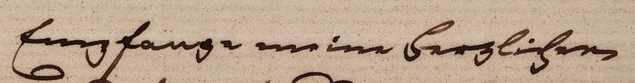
Empfange meine herzlichen
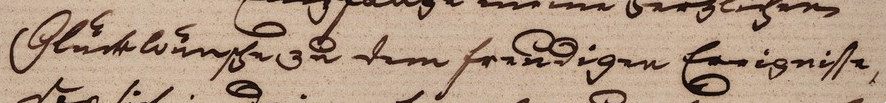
Glückwünsche zu dem freudigen Ereignisse,
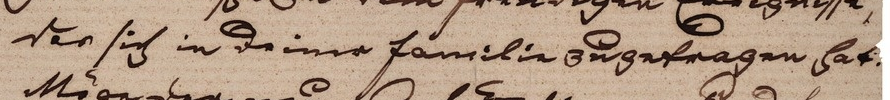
das sich in Deiner Familie zugetragen hat.
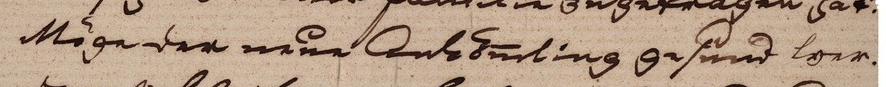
Möge der neue Ankömmling gesund wer-
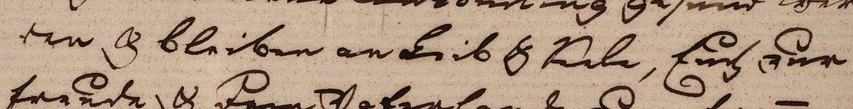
den & bleiben an Leib & Seele, Euch zur
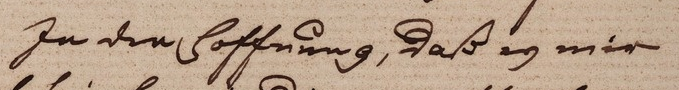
In der Hoffnung, daß es mir
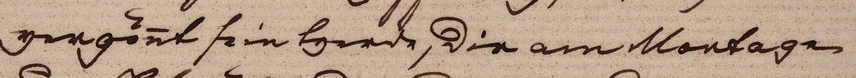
vergönnt sein werde, Dir am Montage
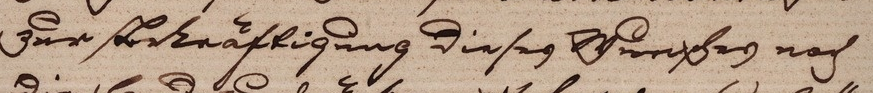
zur Bekräftigung dieses Wunsches noch
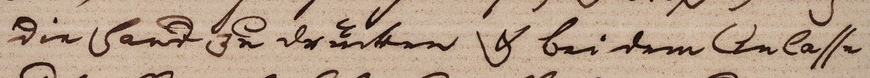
die Hand zu drücken & bei dem Anlasse
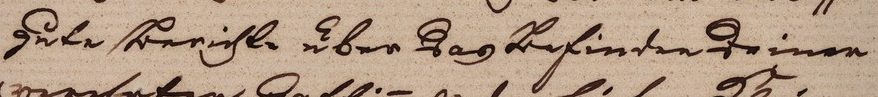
gute Berichte über das Befinden Deiner
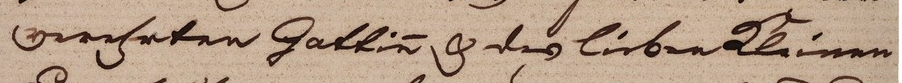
verehrten Gattinn & des lieben Kleinen
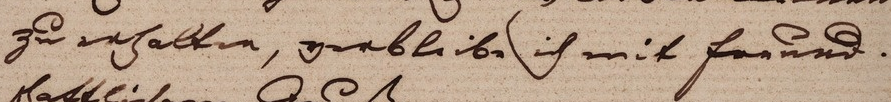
zu erhalten, verbleibe ich mit freund-
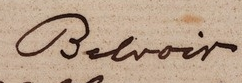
Belvoir
